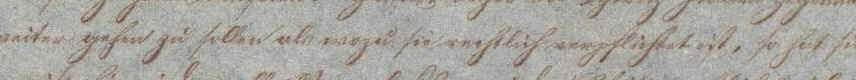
weiter gehen zu sollen als wozu sie rechtlich verpflichtet ist, so hat sie
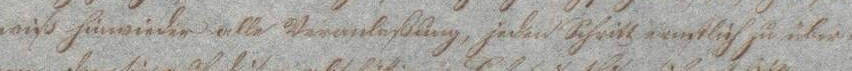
gewiß hinwieder alle Veranlaßung, jeden Schritt ernstlich zu über-
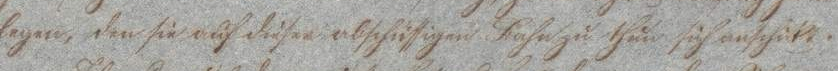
legen, den sie auf dieser abschüssigen Bahn zu thun sich anschickt.
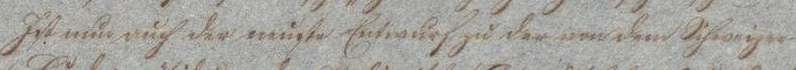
Ist nun auch der neueste Entwurf zu der von dem Schweizerischen
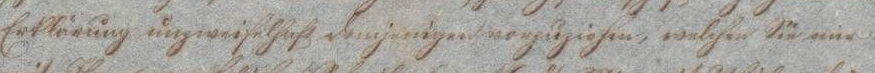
Erklärung unzweifelhaft demjenigen vorzuziehen, welche Sie mir
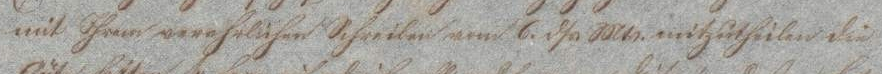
mit Ihrem verehrlichen Schreiben vom 6. dss. Mts. mitzutheilen die
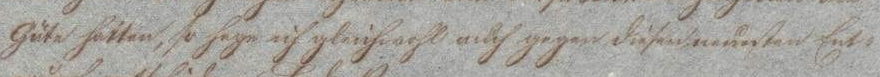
Güte hatten, so hege ich gleichwohl auch gegen diesen neuesten Ent-
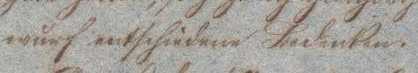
wurf entschiedene Bedenken.
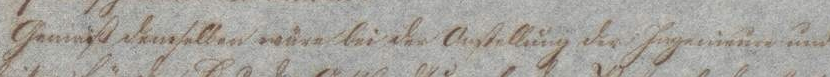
Gemäß demselben wäre bei der Anstellung der Ingenieure und
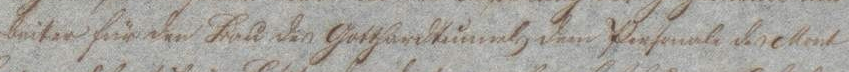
Arbeiter für den Bau des Gotthardtunnels dem Personale des Mont
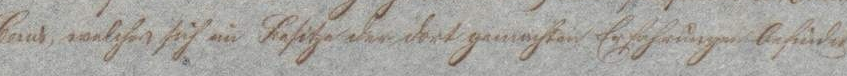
Cenis, welches sich im Besitze der dort gemachten Erfahrungen befindet,
